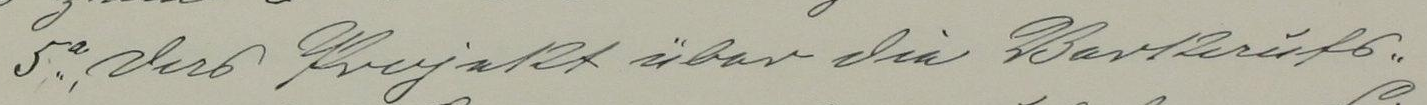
5a. Das Projekt über die Verkaufs-
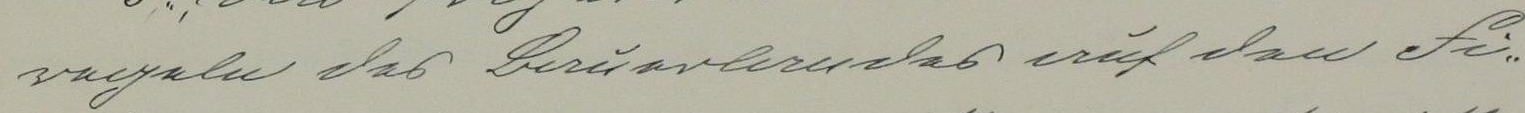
regeln des Bauerlandes auf den Fi-
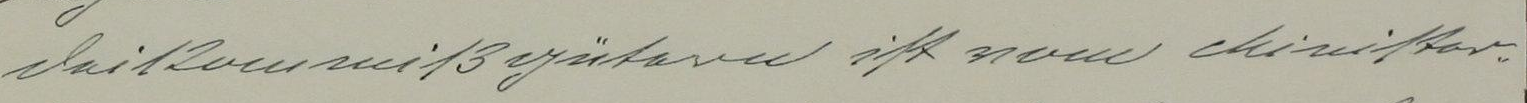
deikommißgütern ist vom Minister-
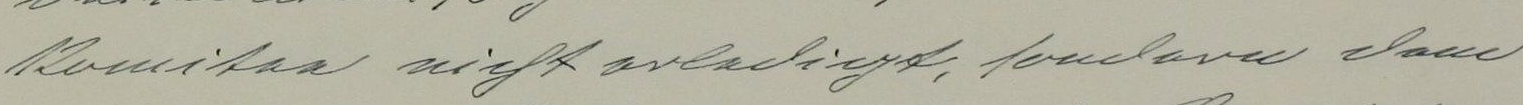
komitee nicht erledigt, sondern dem
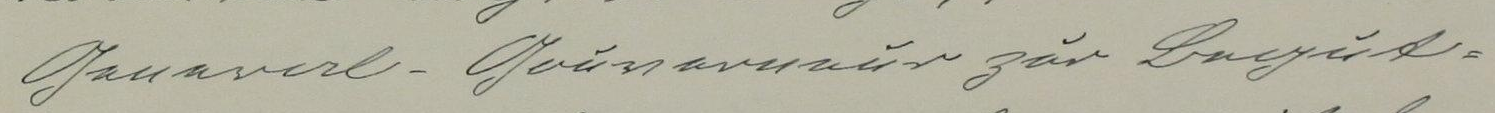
General-Gouverneur zur Begut-
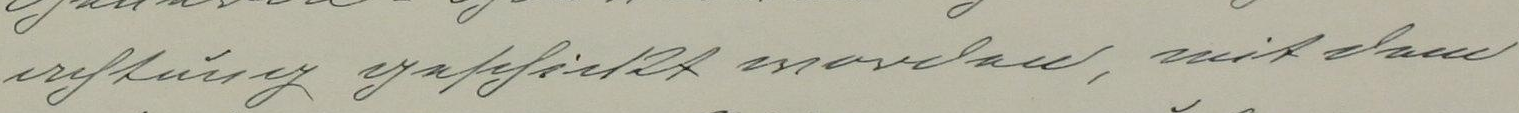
achtung geschickt worden, mit dem
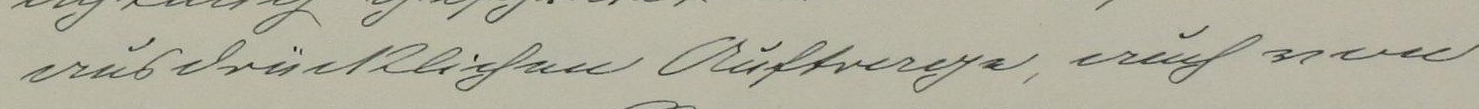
ausdrücklichen Auftrage, auch von
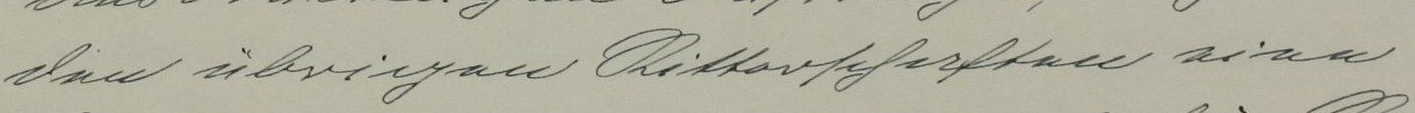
den übrigen Ritterschaften eine
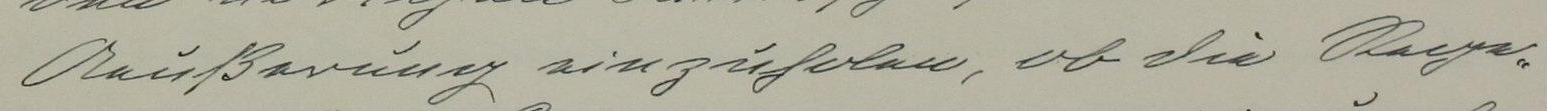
Aeußerung einzuholen, ob die Rege-
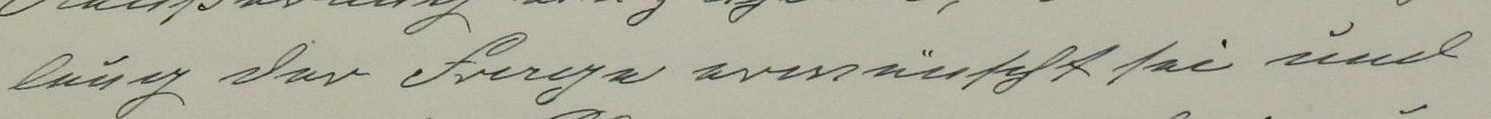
lung der Frage erwünscht sei und
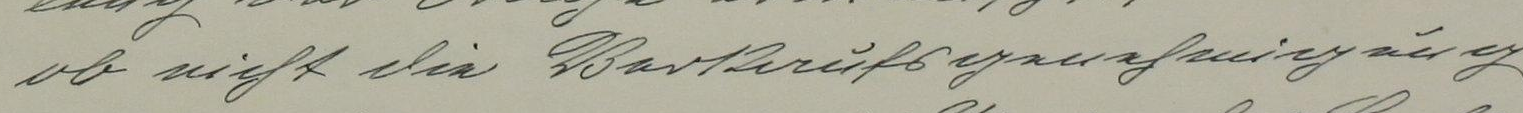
ob nicht die Verkaufsgenehmigung
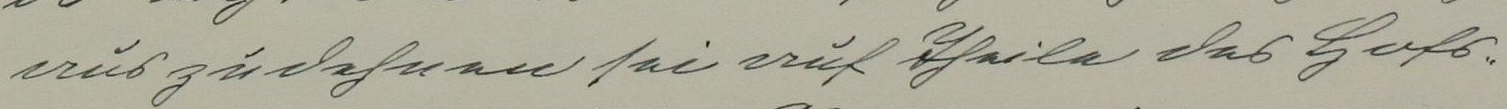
auszudehnen sei auf Theile des Hofs-
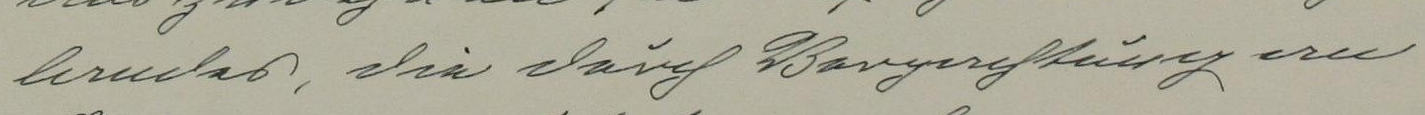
landes, die durch Verpachtung an
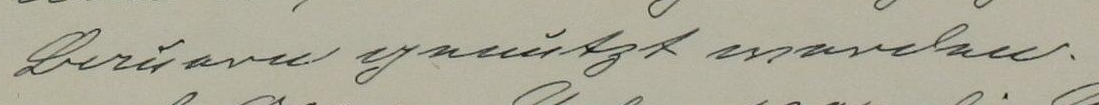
Bauern genutzt werden.
